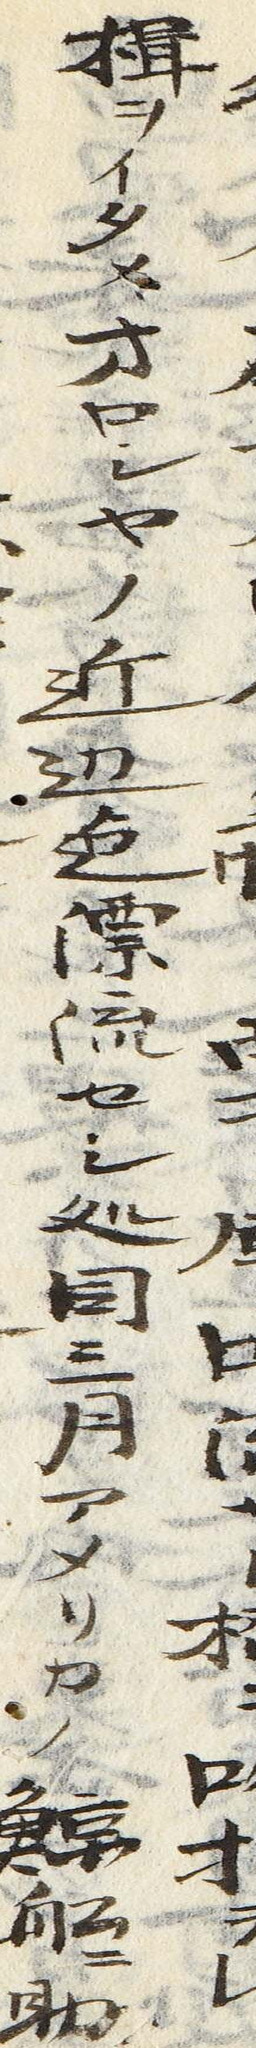楫ヲイタメオロシヤノ近辺迄漂流セシ処同三月アメリカノ鯨船ニ助
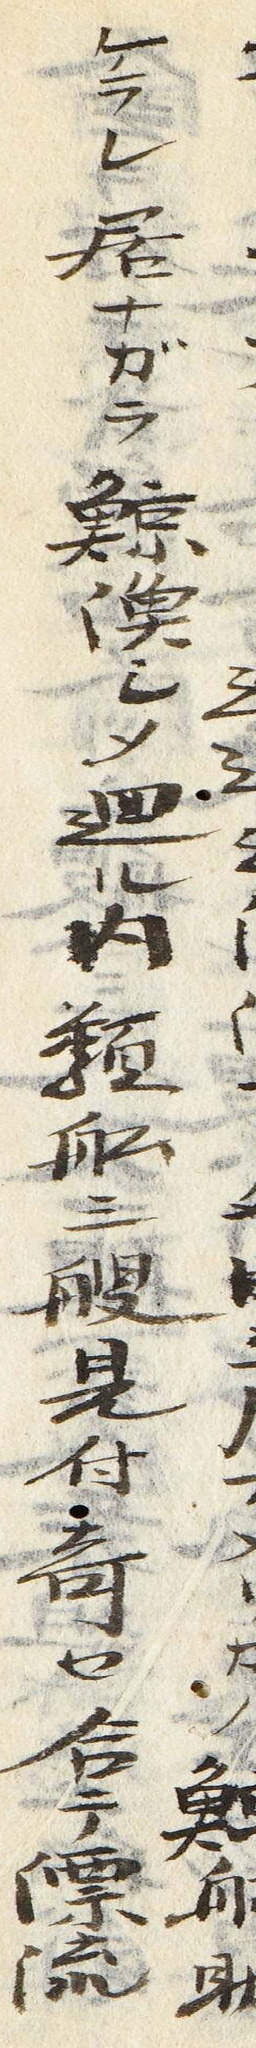ケラレ居ナガラ鯨漁シメ廻ル内類船三艘見付寄セ合テ漂流

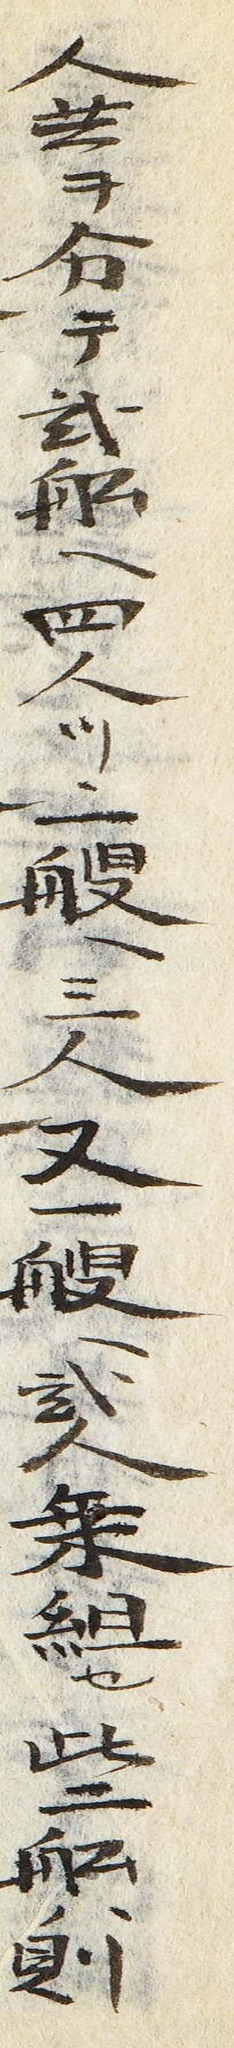人共ヲ分テ弐艘へ四人ツヽ一艘へ三人又一艘へ弐人乗組セ此二船ハ則
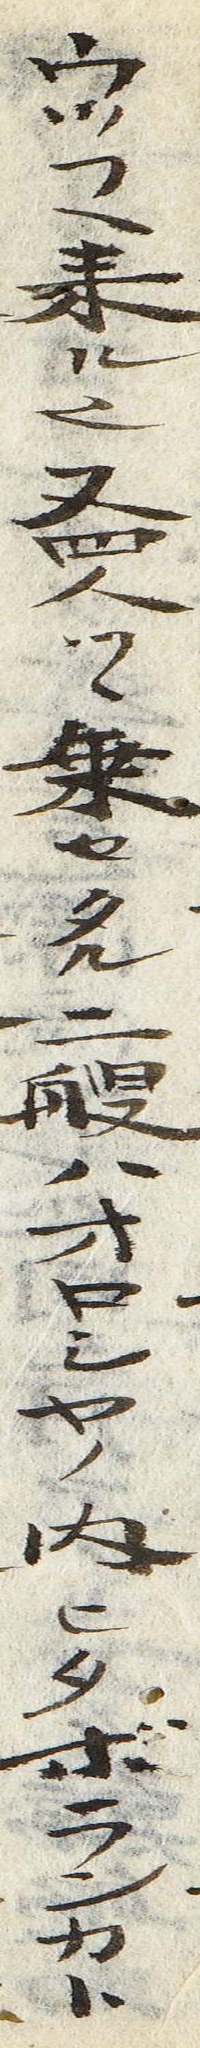ウツフヘ来ル也又四人ツヽ乗セタル二艘ハオロシヤノ内ヒタボランカト
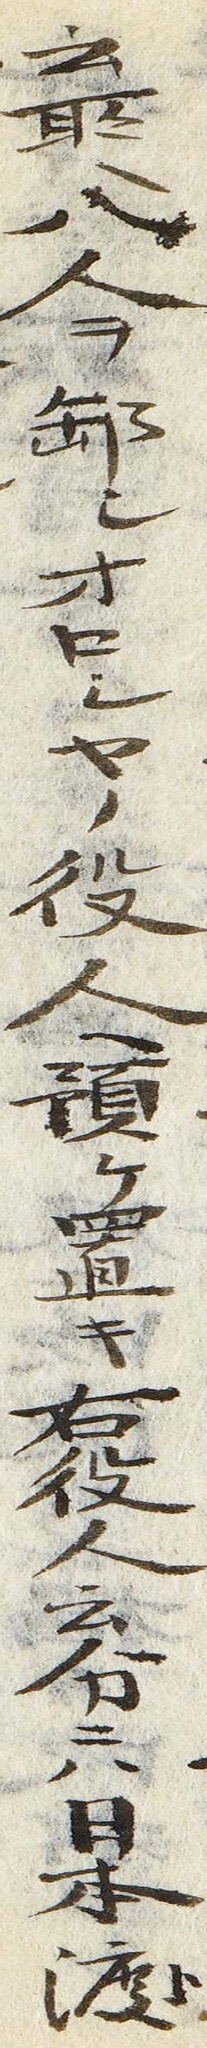云所へ八人ヲ卸シオロシヤノ役人ヘ預ケ置キ右役人云分ニハ日本渡
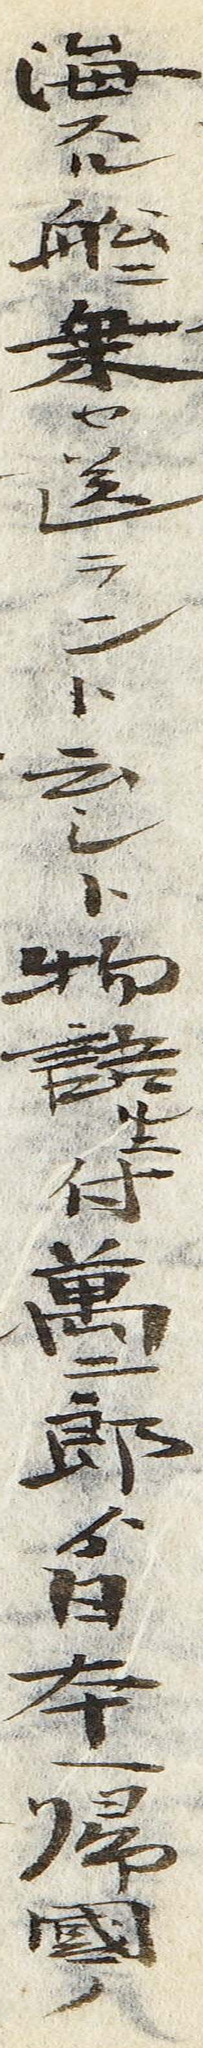海スル船ニ乗セ送ラント云シト物語ルニ付萬二郎ゟ日本ヘ帰国ノ
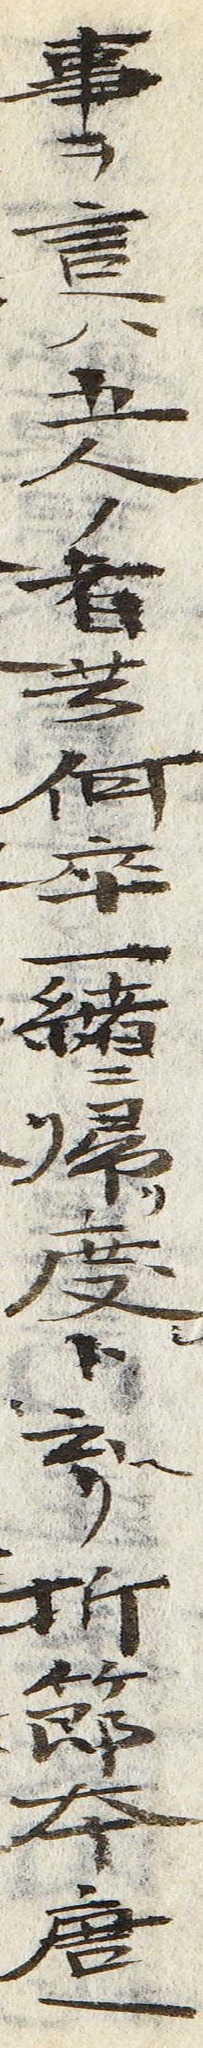事ヲ言ヘハ五人ノ者共何卒一緒ニ帰リ度シト云ヘリ折節本唐へ
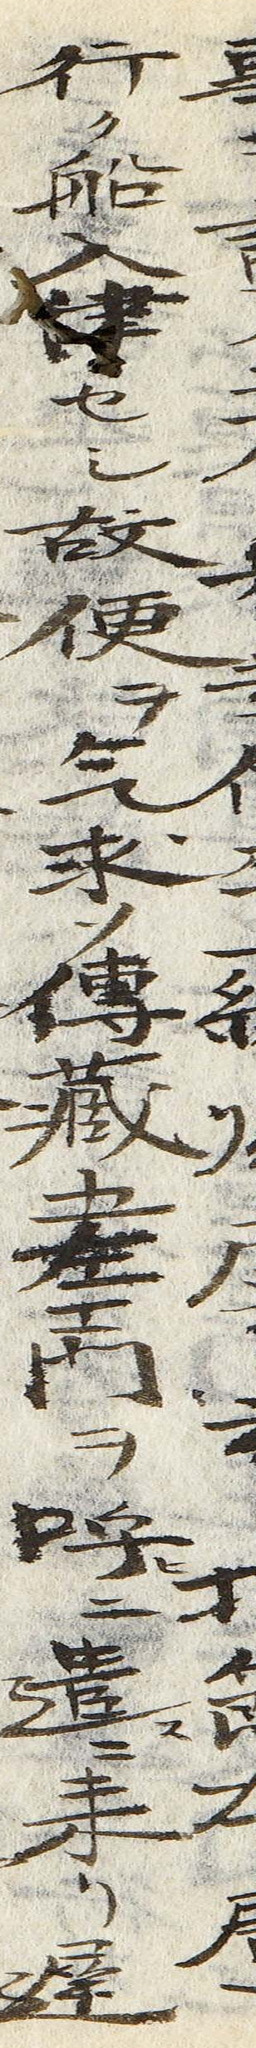行ク船入津セシ故便ヲ乞求メ傳蔵御五座衛門ヲ呼ヒニ遣スニ来リ遅
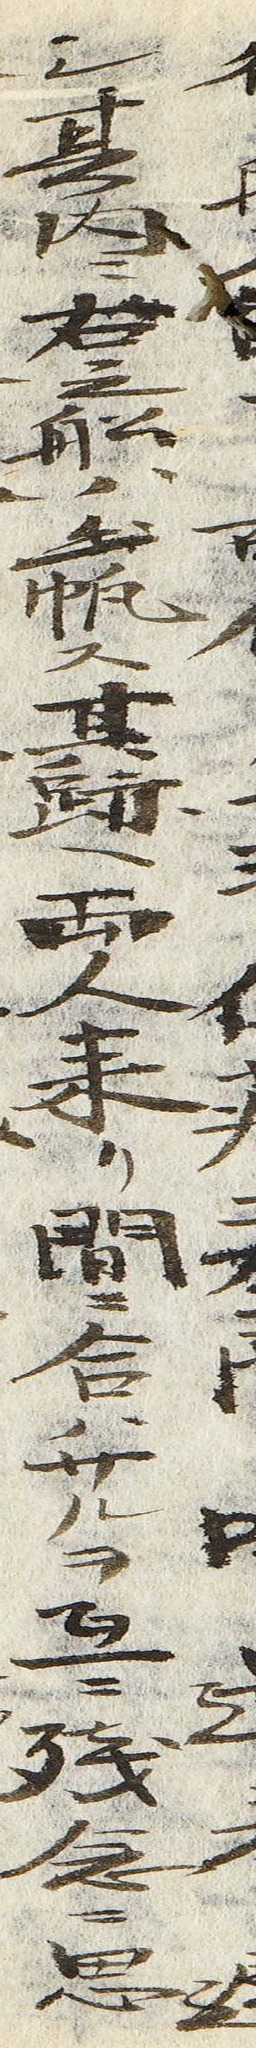シ其内ニ右之船ハ出帆ス其跡ヘ両人来リ間ニ合ハサルヲ互ニ残念ニ思
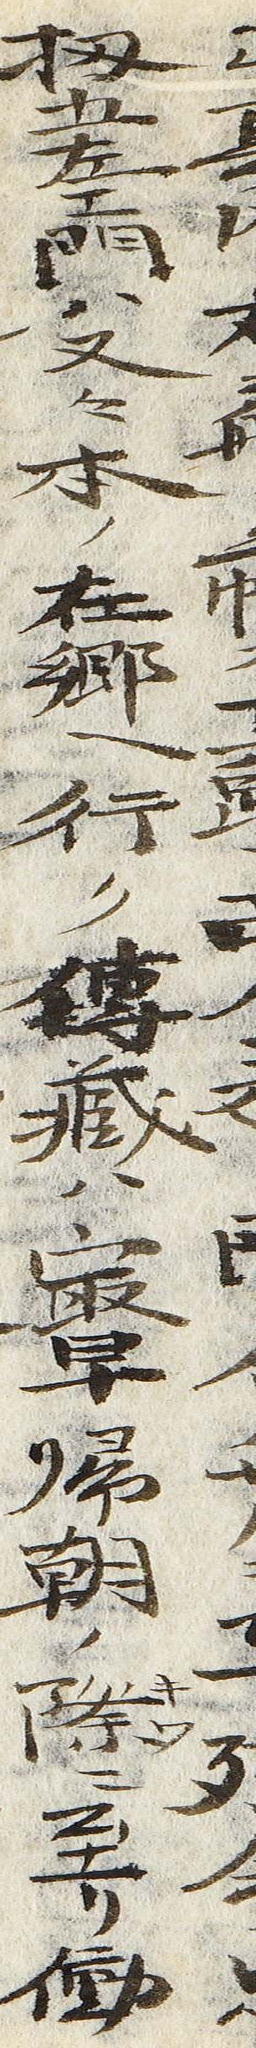扨五左衛門ハ又々本ノ在郷ヘ行ク傳蔵ハ最早帰朝ノ際ニ至リ働
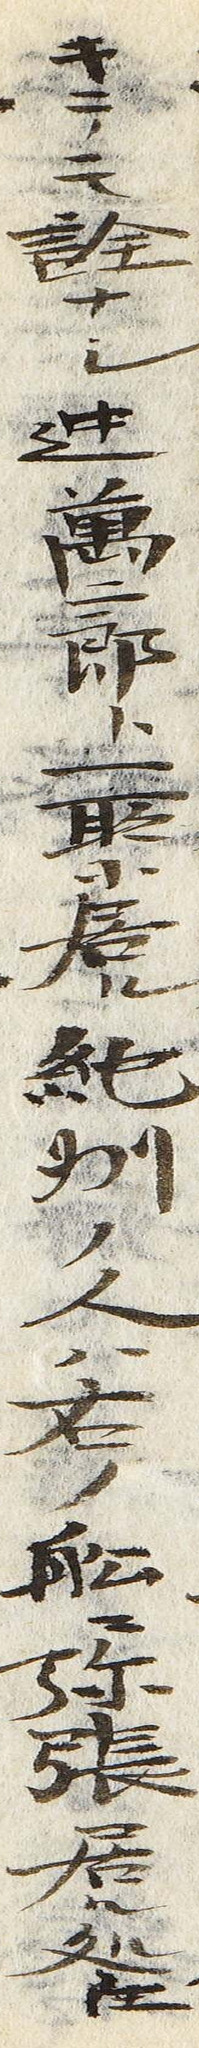キテモ詮ナシ迚萬二郎ト一緒に居ル紀州ノ人ハ右ノ弥張居ル処
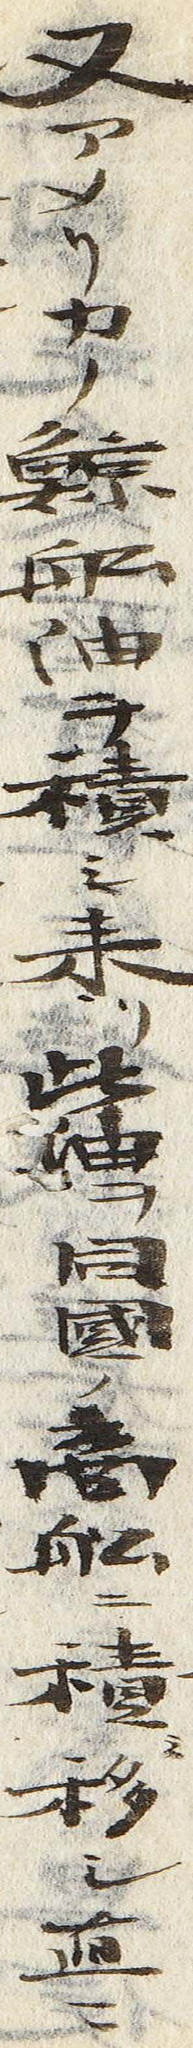又アメリカノ鯨船油ヲ積ミ来リ此油ヲ同国ノ商船ニ積ミ移シ直ニ
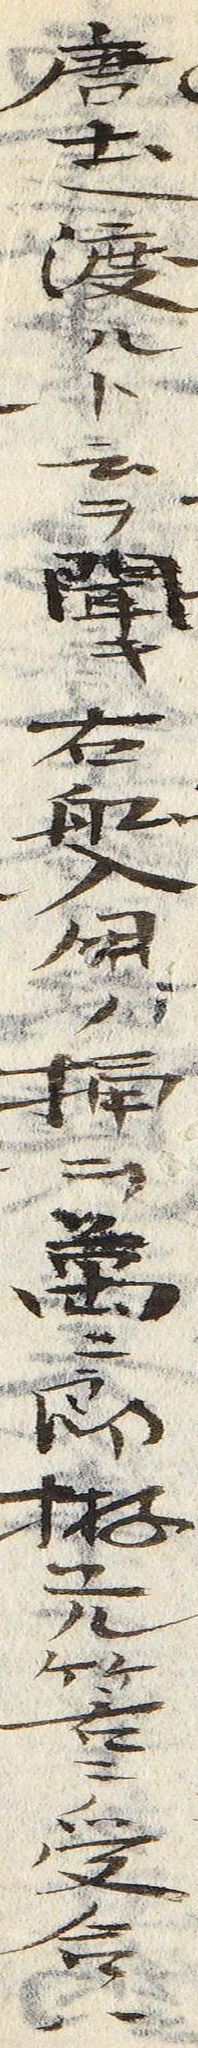唐土へ渡ルト云ヲ聞キ右船用ノ挿ヲ萬二郎拵ユル筈ニ受合ハ
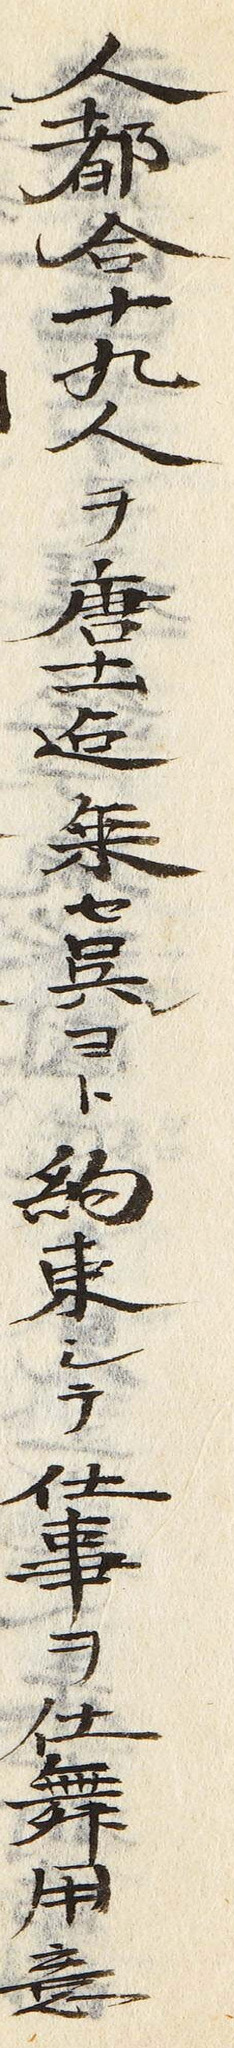人都合十九人ヲ唐土迄乗セ呉ヨト約束シテ仕事ヲ仕舞用意
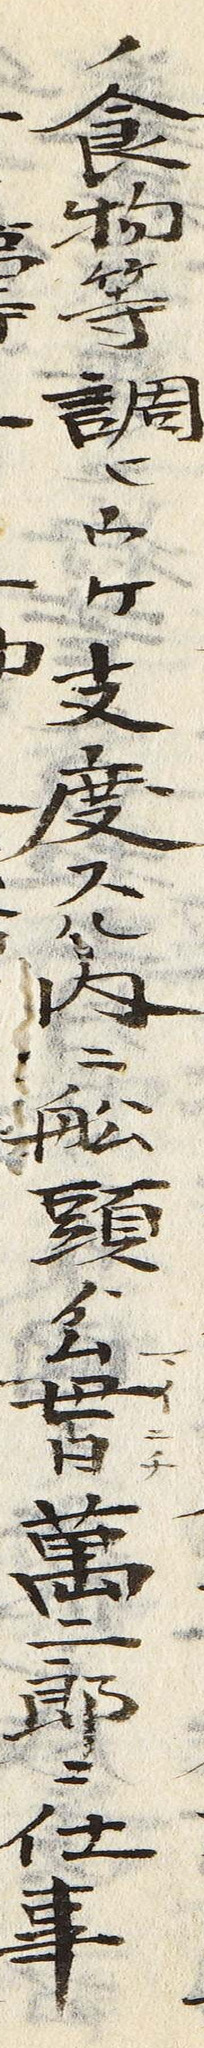ノ食物等調ヒウケ支度スル内ニ船頭ゟ毎日萬二郎ニ仕
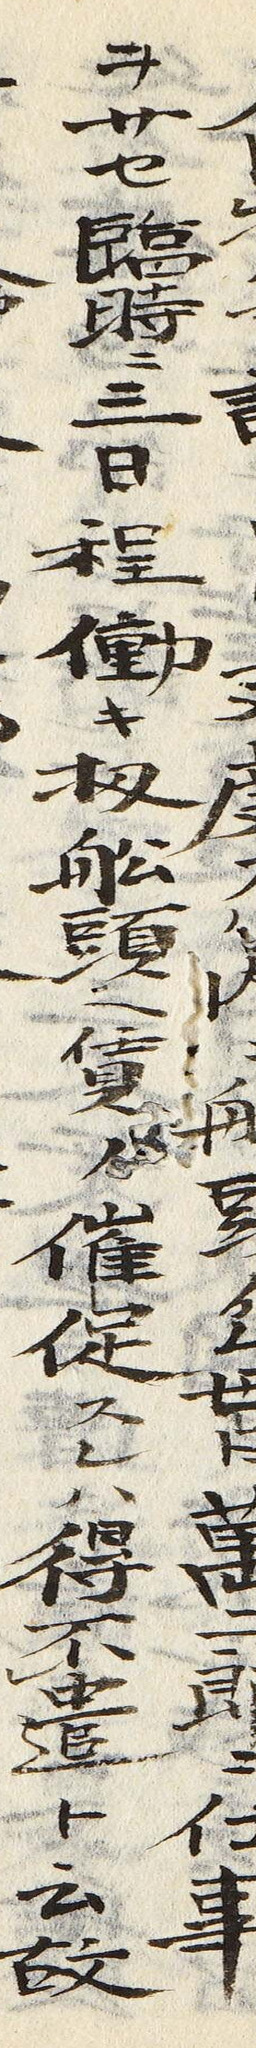ヲサセ臨時ニ三日程働キ扨船頭ヘ賃ノ催促スレハ得不遣ト云故
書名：漂流記聞
